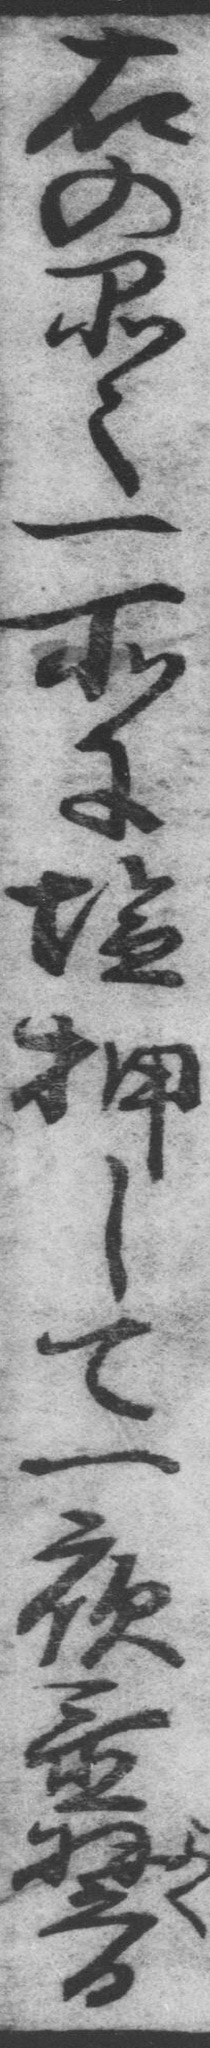右の品々一所に塩押して一夜置翌日

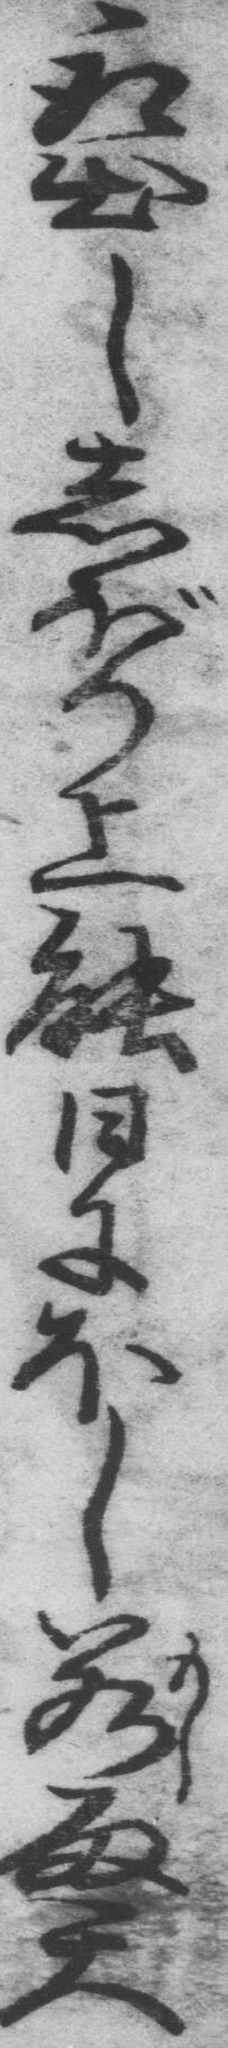取出ししぼり上能日にほし若雨天
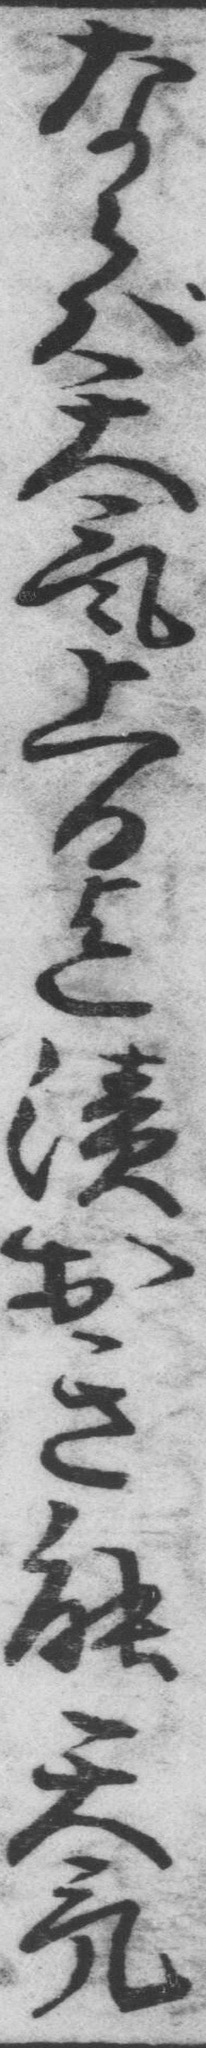ならば天気上る迄漬おき能天気
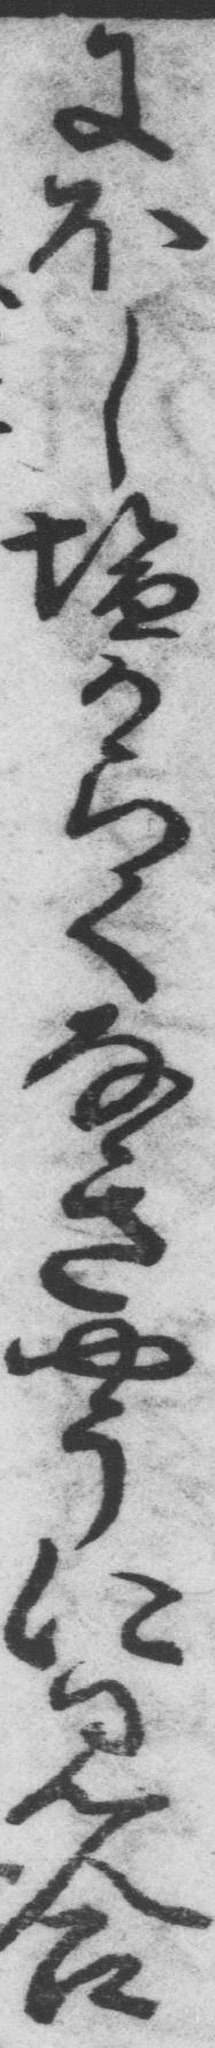にほし塩からくなきやうに見合
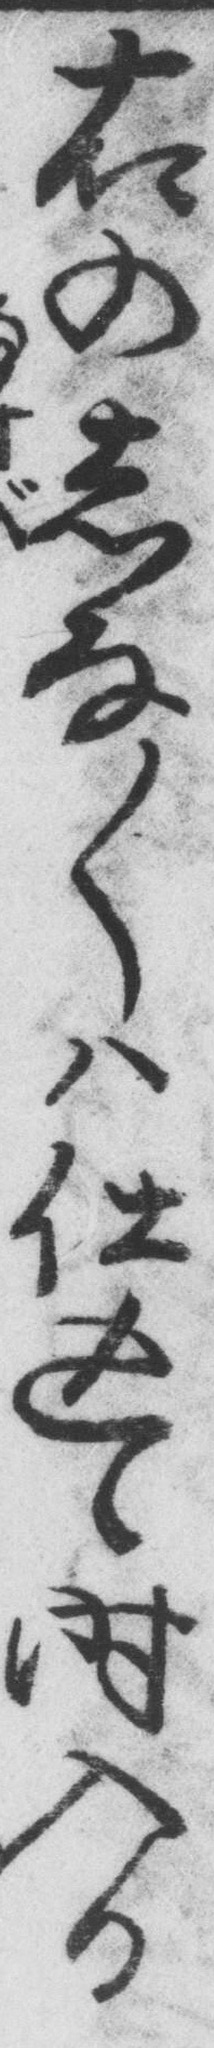右のしな〳〵は仕込候時入る
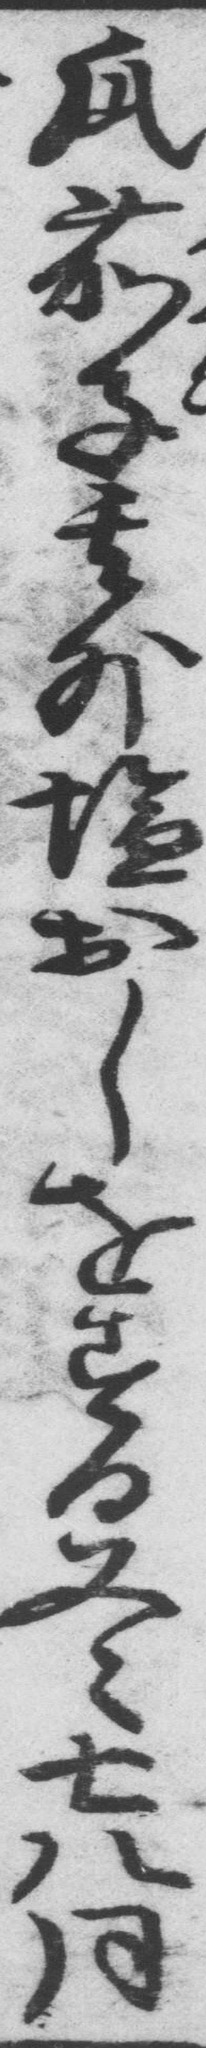瓜茄子其外塩おしをする又々七八月
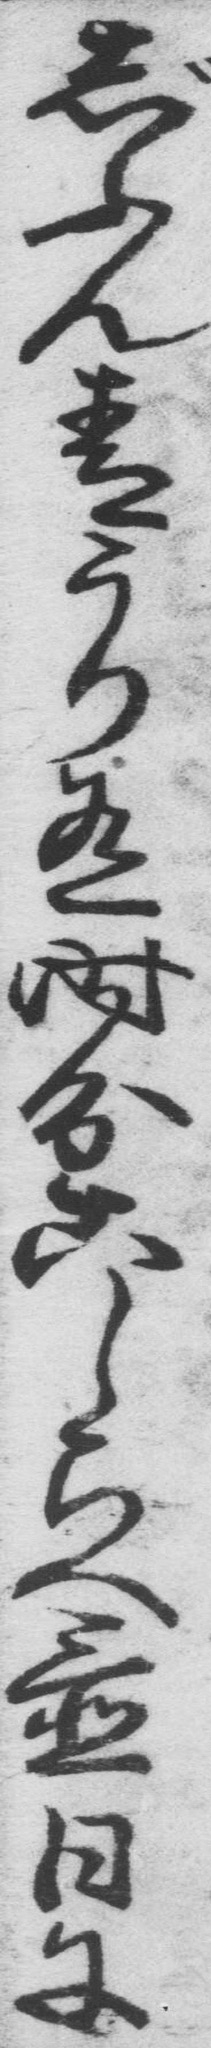じふん青うり有時分こしらへ置日に
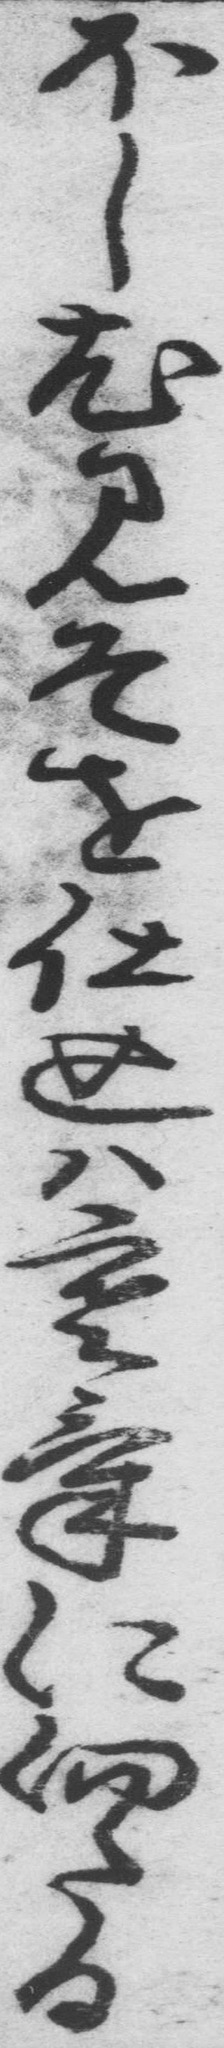ほし尤みそを仕込は寒気に向たる
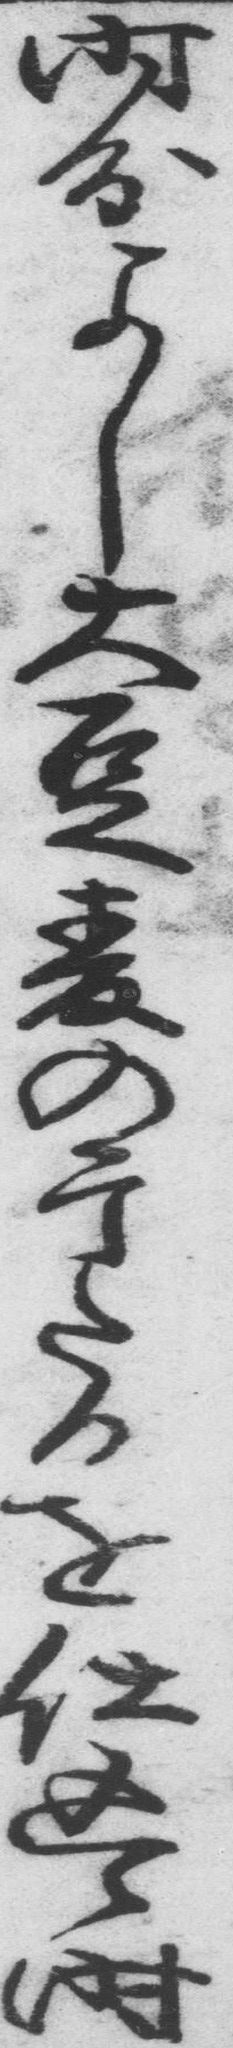時分よし大豆麦の干たるを仕込候時
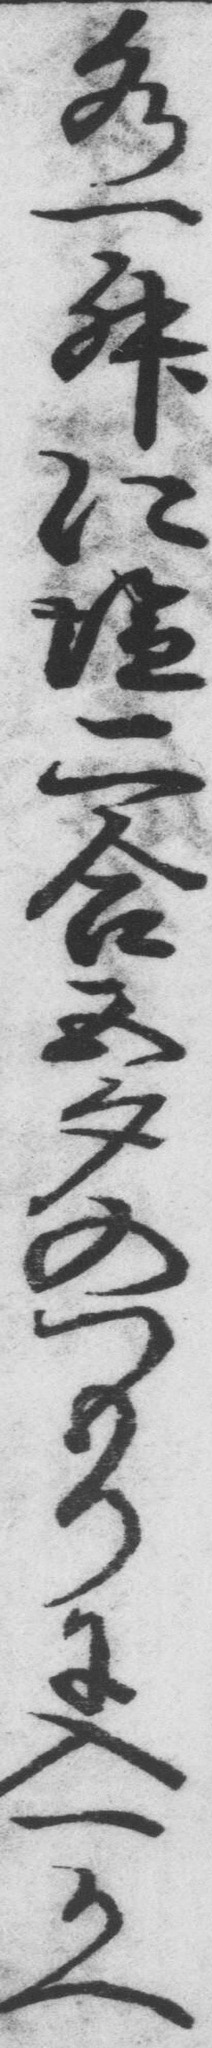水一升に塩二合五勺のつもりに入一かへ
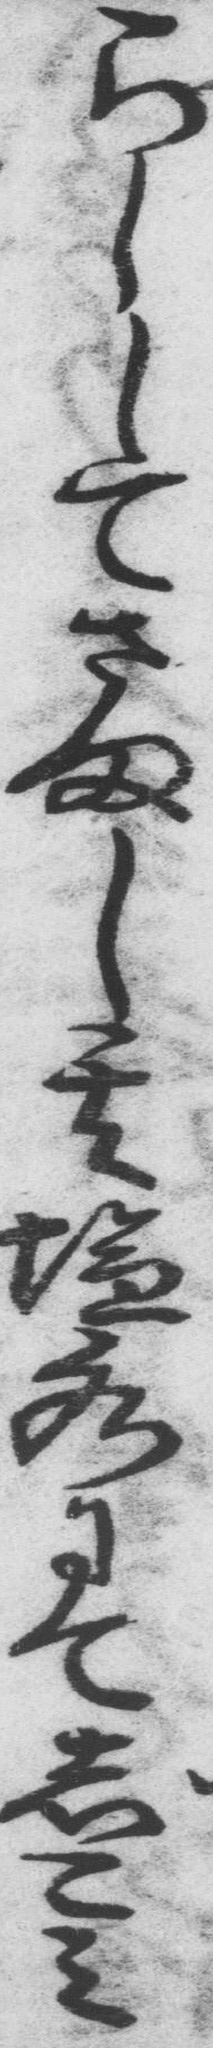らししてさまし其塩水にてしこみ
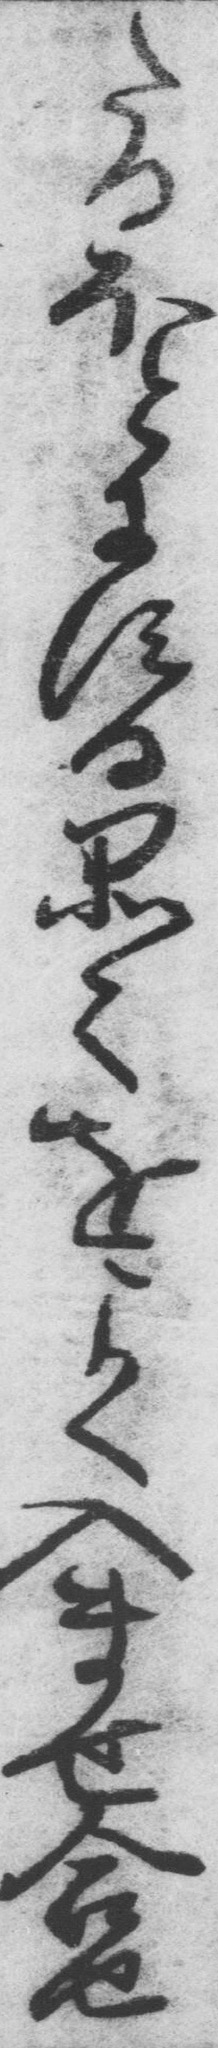たるほとにする品々をよく入ませ合せ
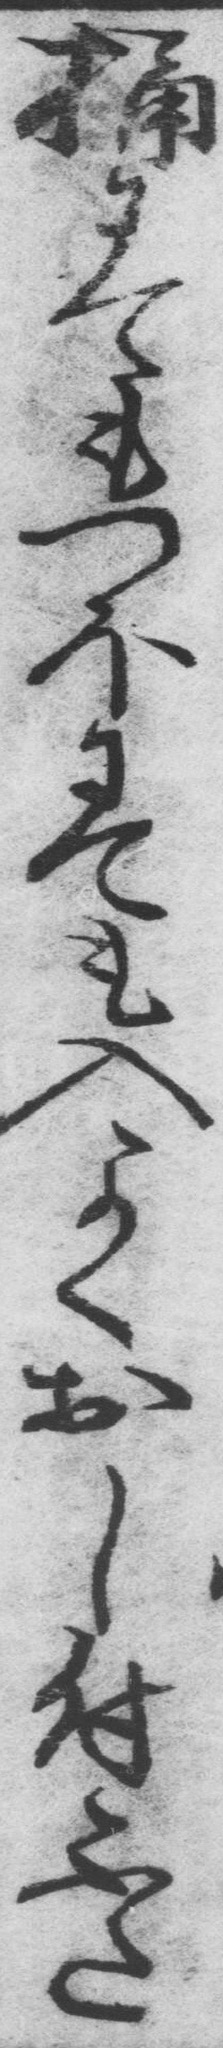桶にてもつほにても入よくおし付ふた
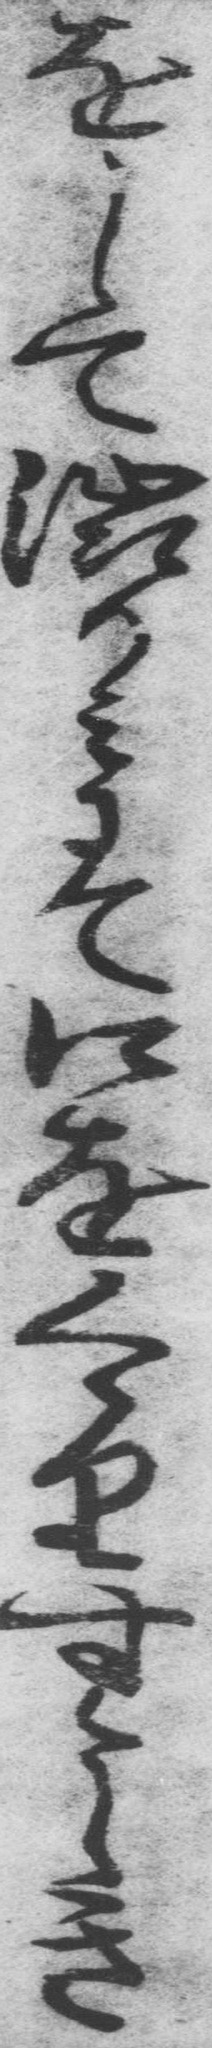をして渋かみにて口をくゝりすゝしき
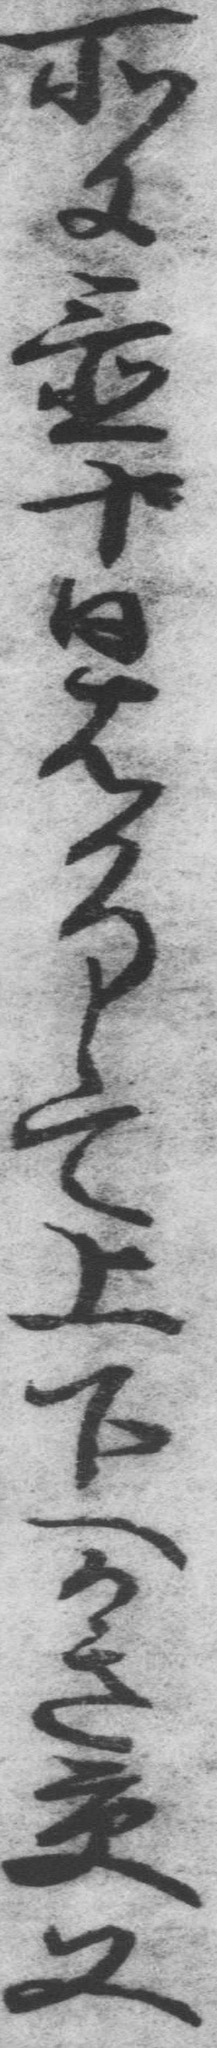所に置十日はかりして上下へかき交又

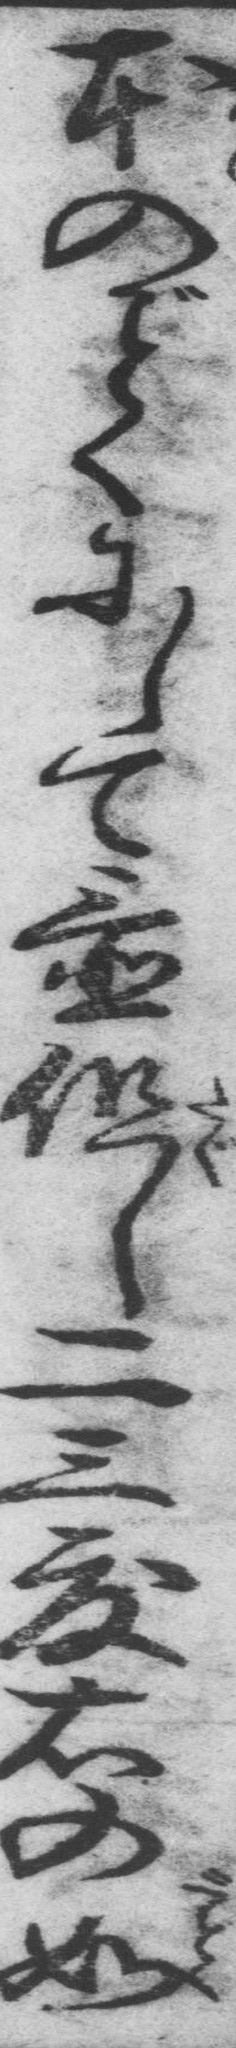本のごとくにして置但し二三度右の如
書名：料理山海郷
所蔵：大阪府立大学学術情報センター 国文学研究資料館
